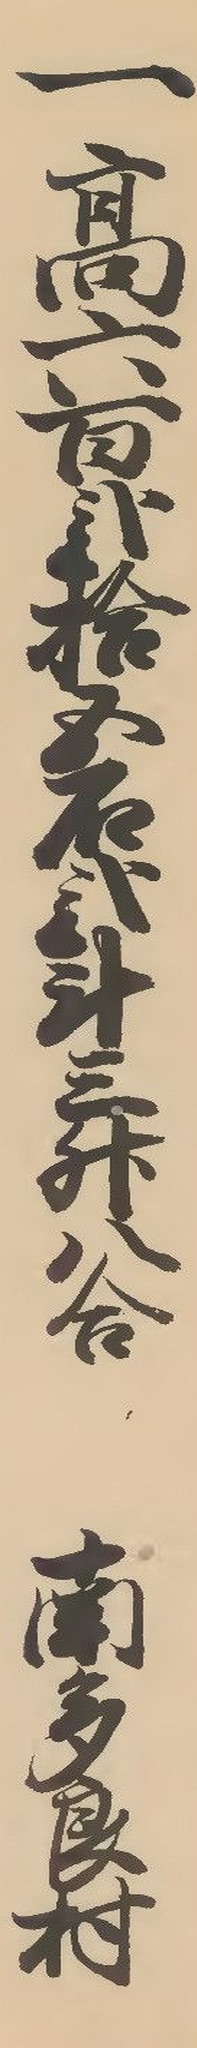一髙六百弐拾五石弐斗三升八合南多良村
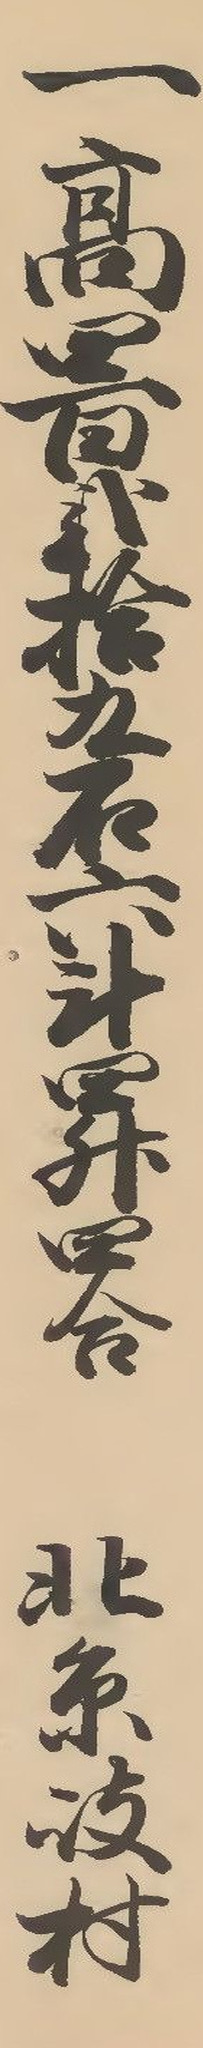一髙四百弐拾九石六斗四升四合北糸岐村
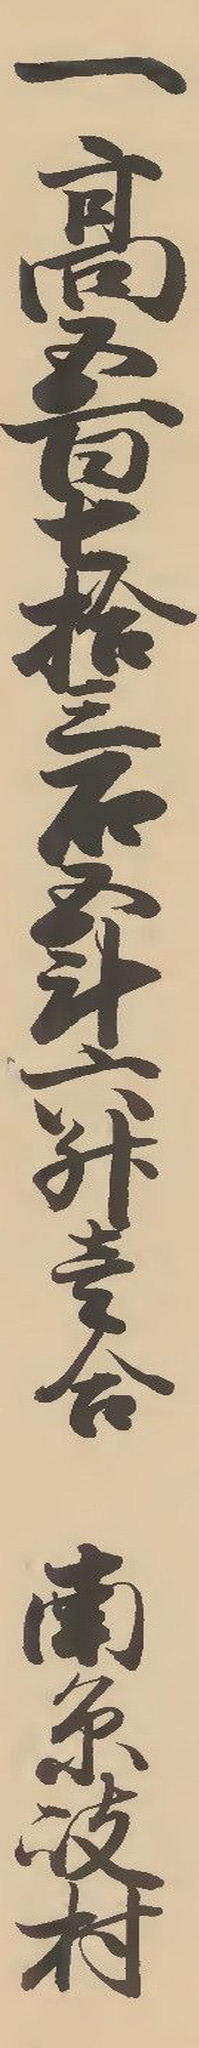一髙五百七拾三石五斗六升壱合南糸岐村
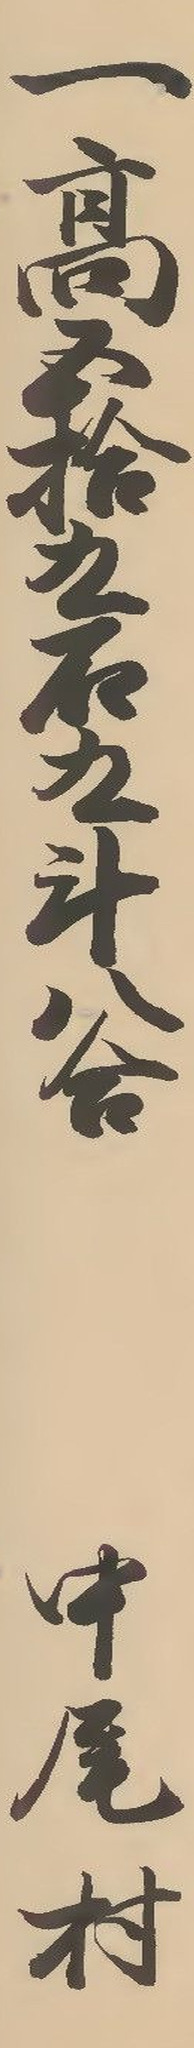一髙五拾九石九斗八合中尾村
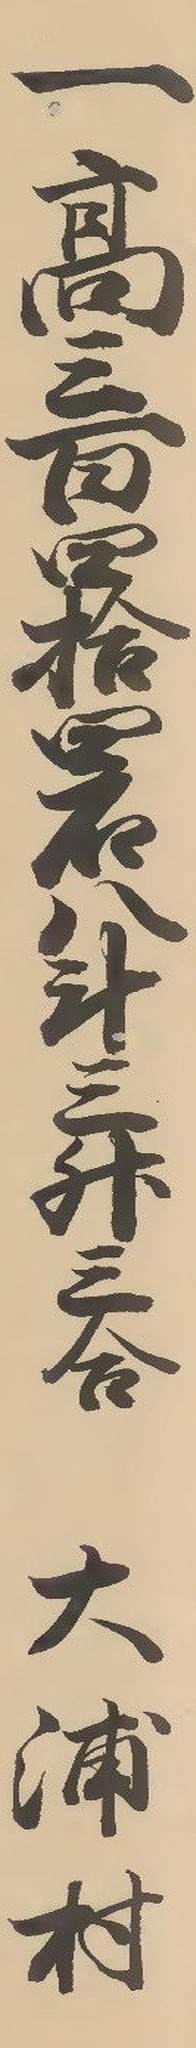一髙三百四拾四石八斗三升三合大浦村
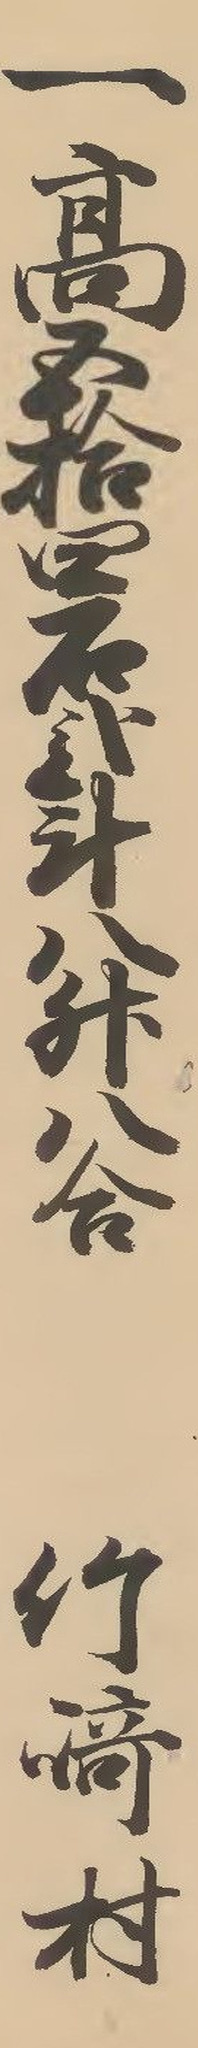一髙五拾四石弐斗八升八合竹崎村
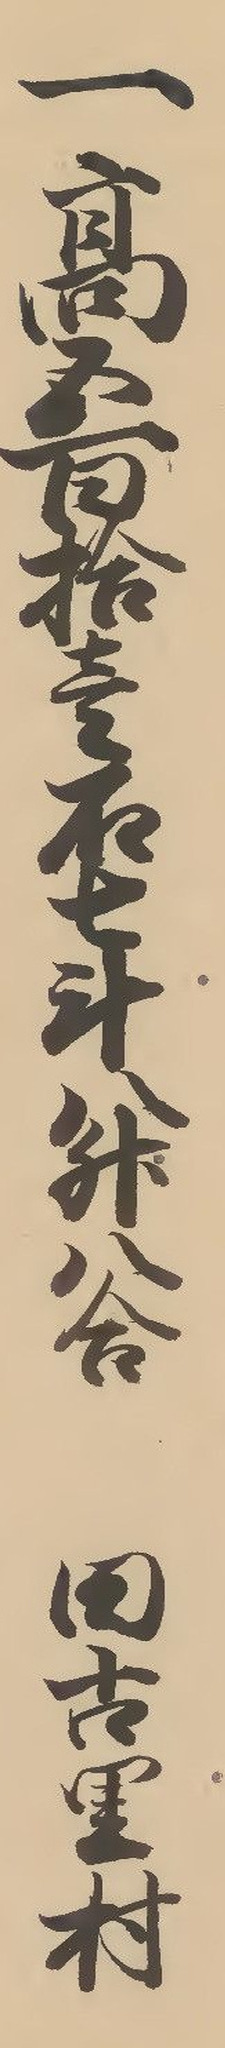一髙五百拾壱石七斗八升八合田古里村
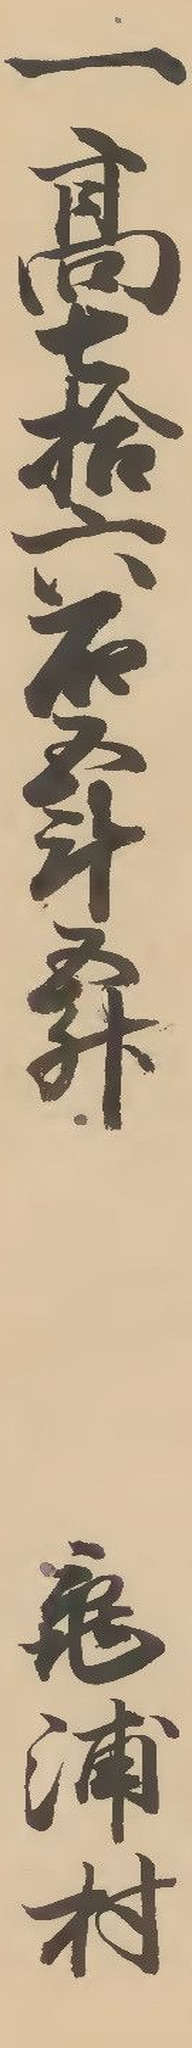一髙七拾六石五斗五升龜浦村

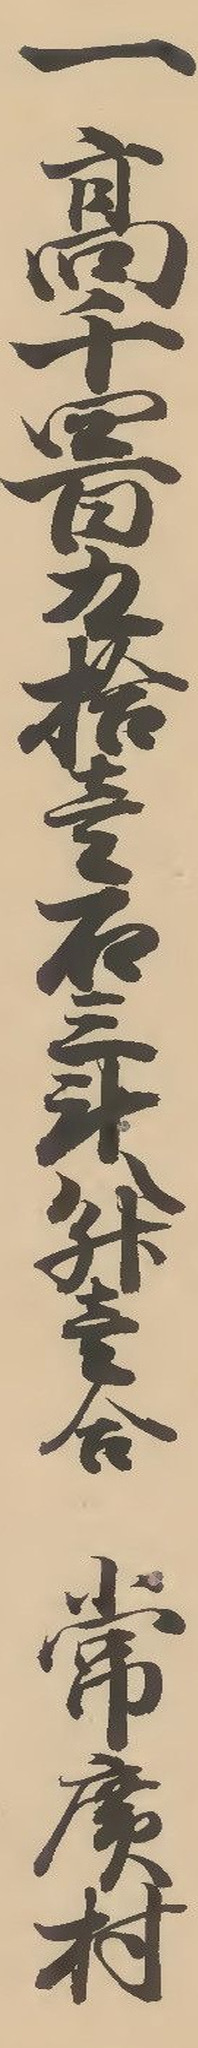一髙千四百九拾壱石三斗八升壱合常廣村
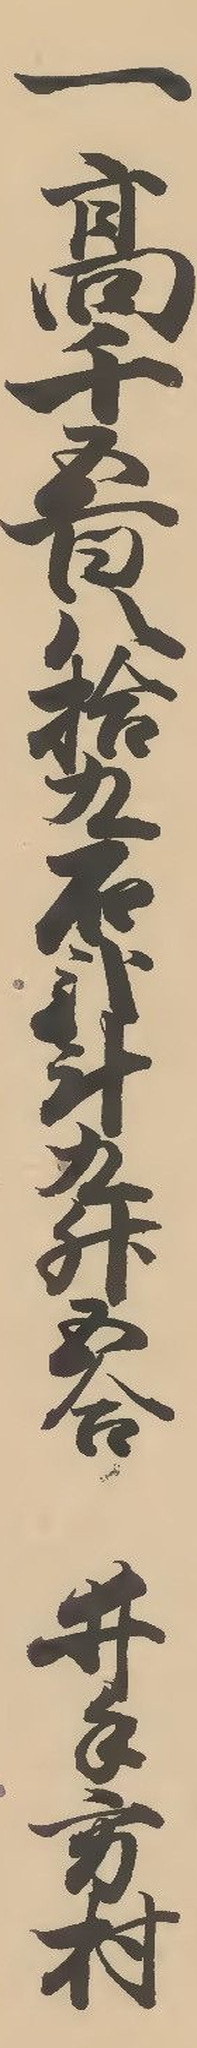一髙千五百八拾九石弐斗九升五合井手方村
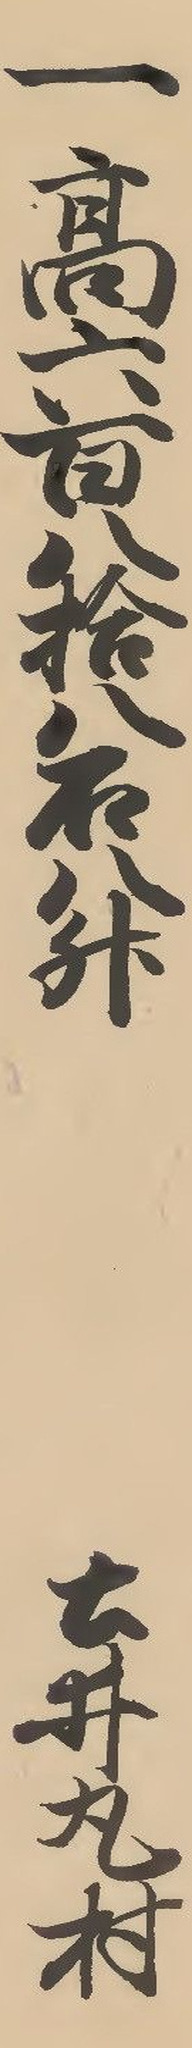一髙六百八拾八石八升土井丸村
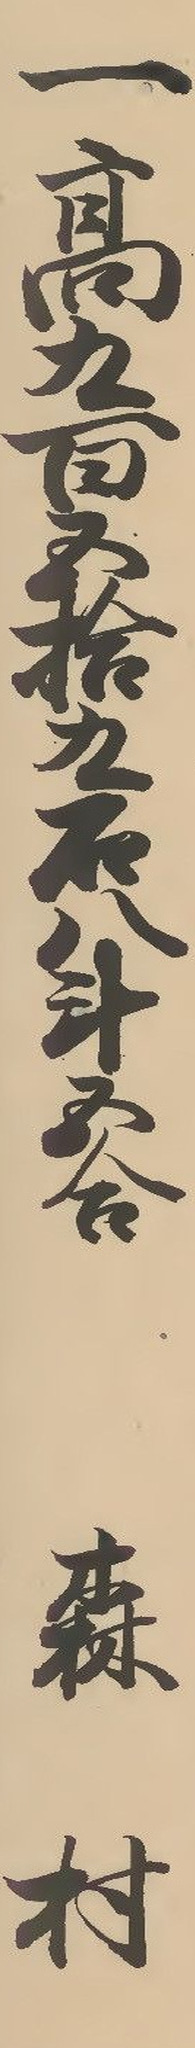一髙九百五拾九石八斗五合森村
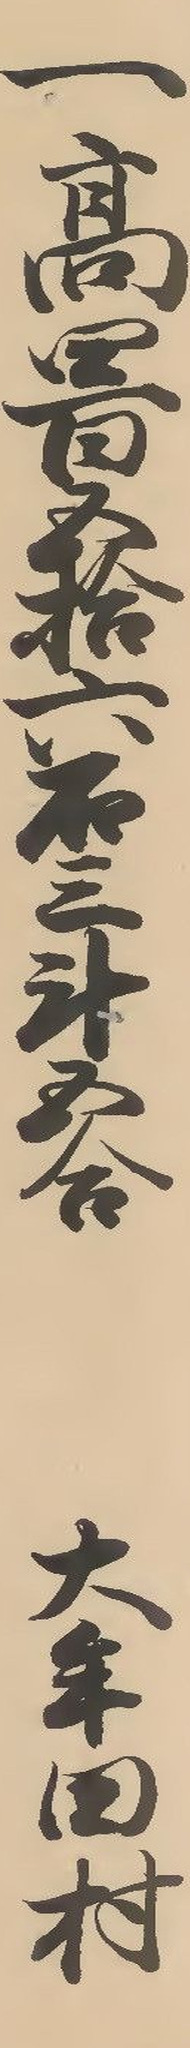一髙四百五拾六石三斗五合大牟田村
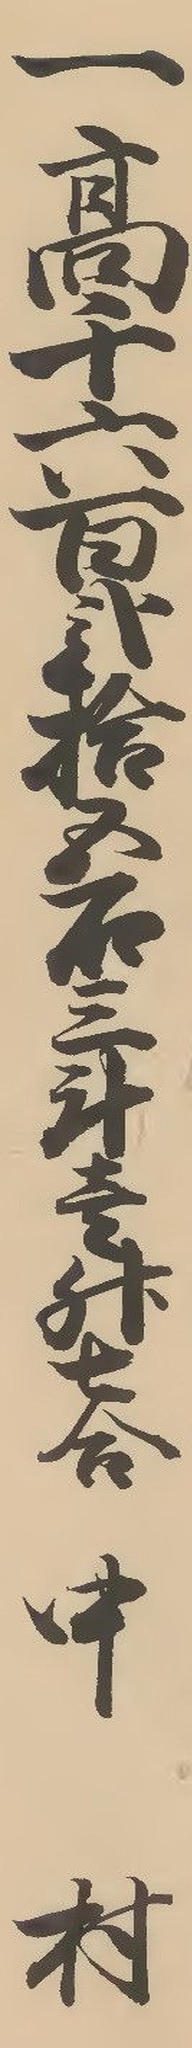一髙千六百弐拾五石三斗壱升七合中村
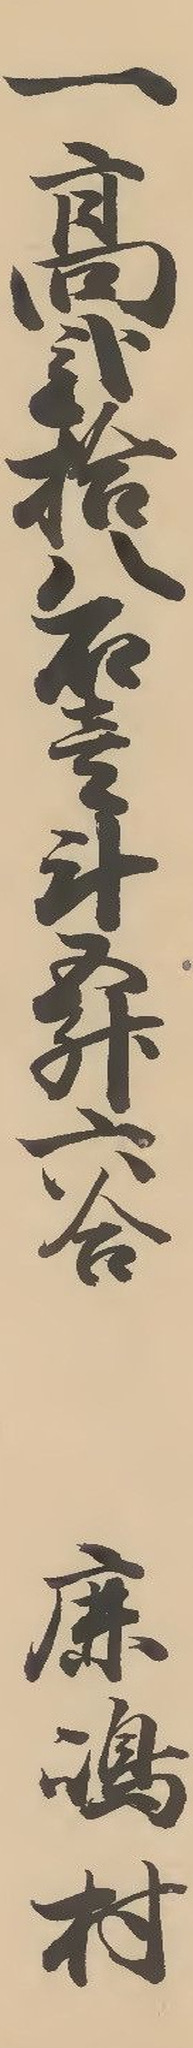一髙弐拾八石壱斗五升六合鹿嶋村
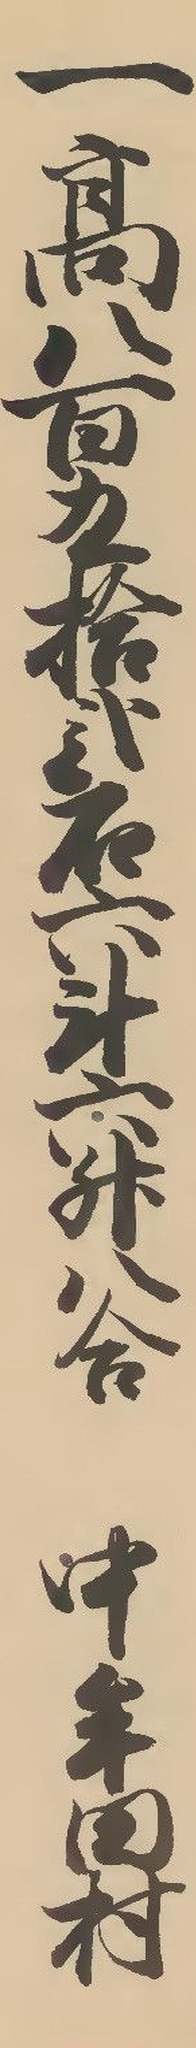一髙八百九拾弐石六斗六升八合中牟田村
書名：肥前国郷帳
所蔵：国立公文書館 National Archives of Japan
